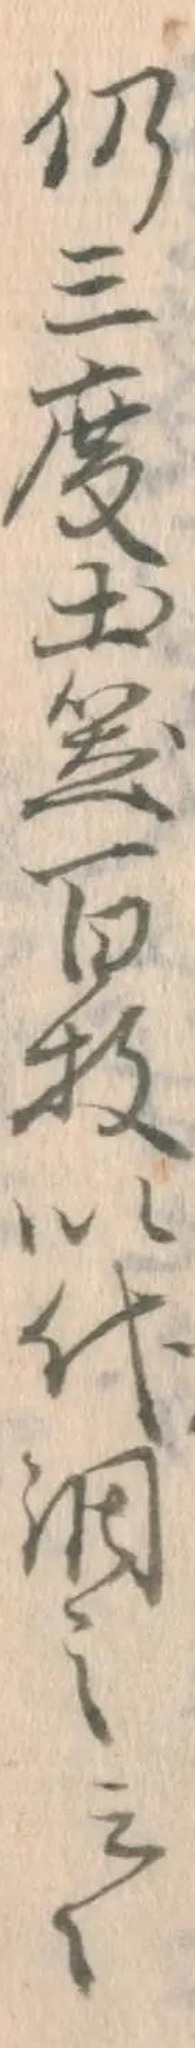仍三度土器百枚以代調之云々
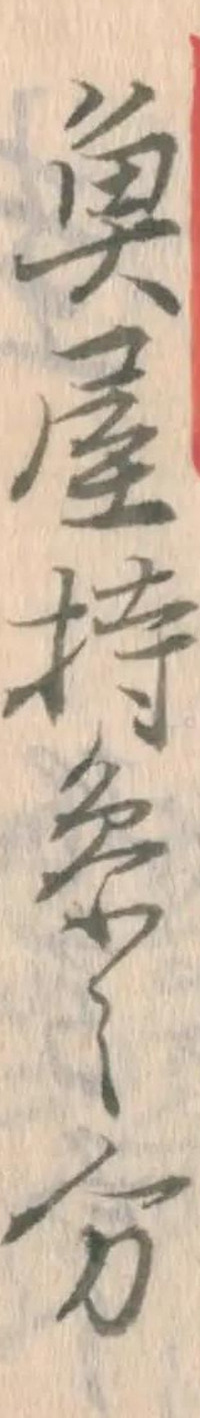魚屋持参之分
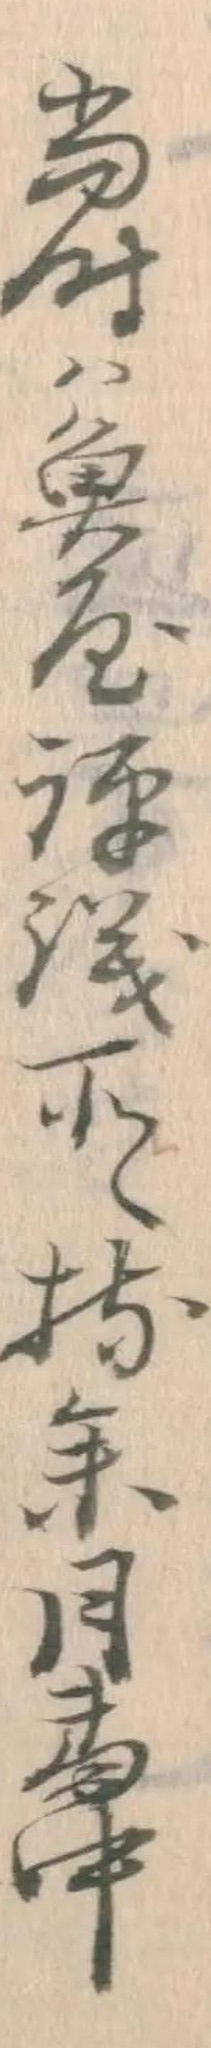当時は魚屋評議所へ持参月番中
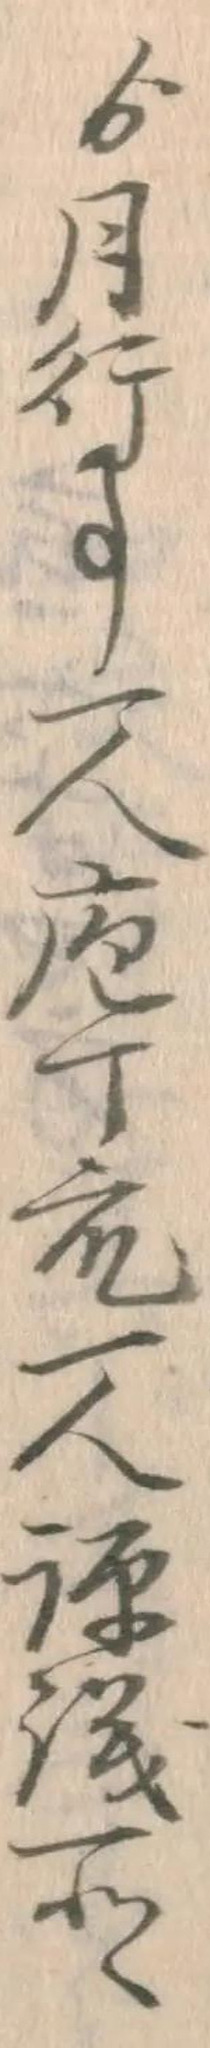ゟ月行事一人庖丁衆一人評議所へ
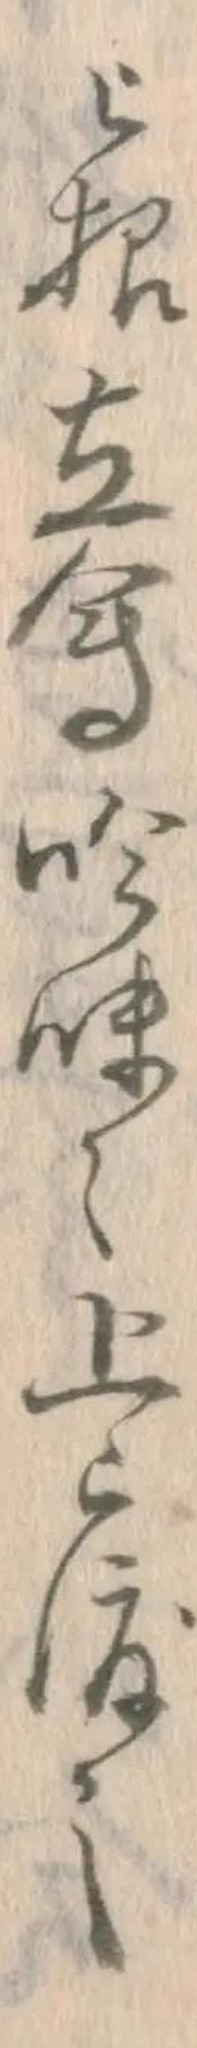被招立会吟味之上被渡之

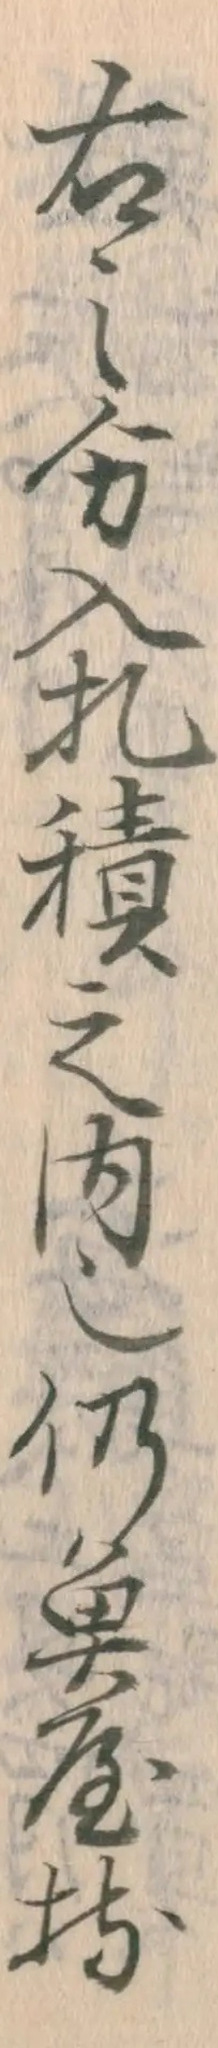右之分入札積之内也仍魚屋持
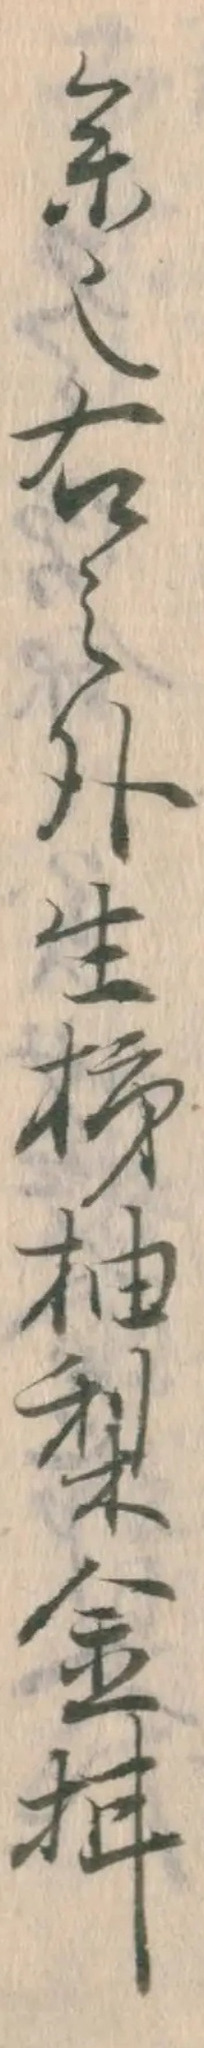参也右之外生柿柚梨金柑
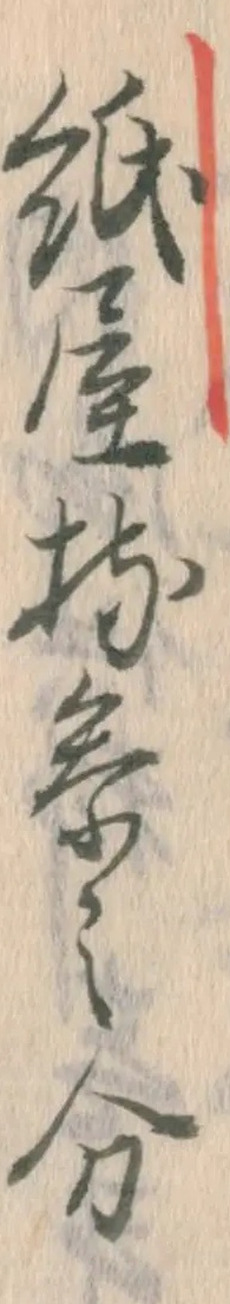紙屋持参之分
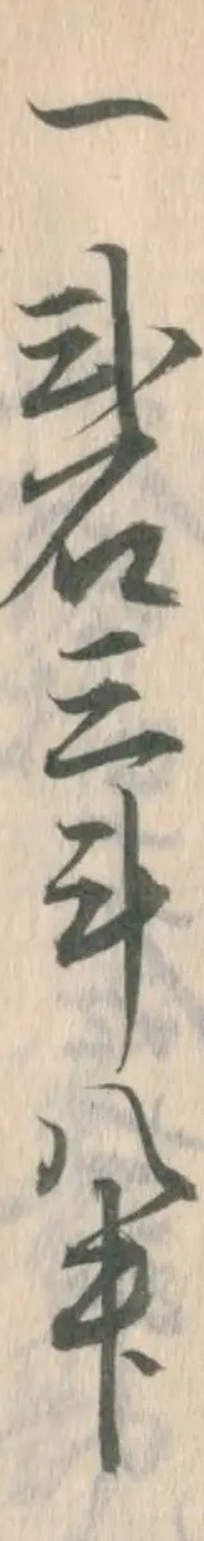一弐石三斗八升

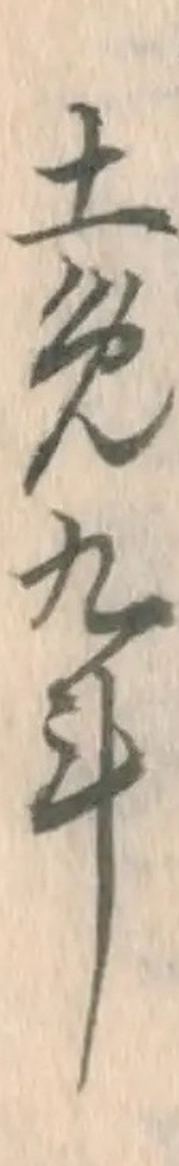土免九斗
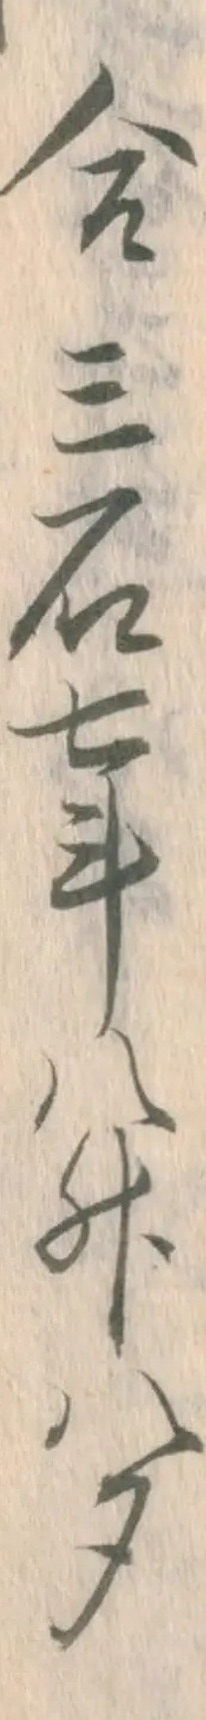合三石七斗八升八勺
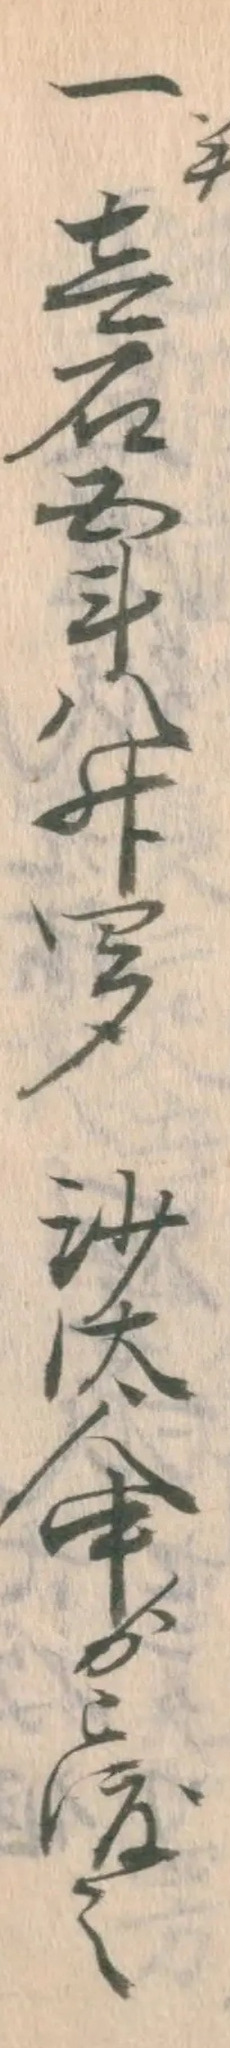一判壱石五斗八升四勺沙汰人中ゟ被渡之
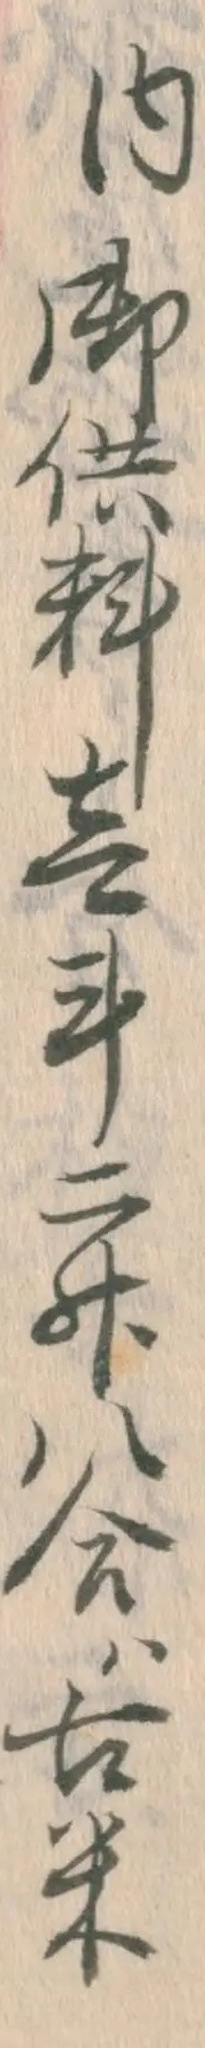内御供料壱斗二升八合は古米
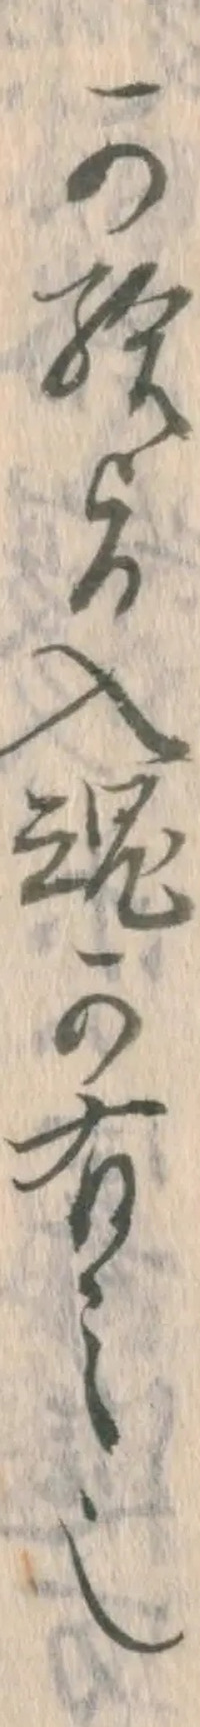可給旨入魂可有之也
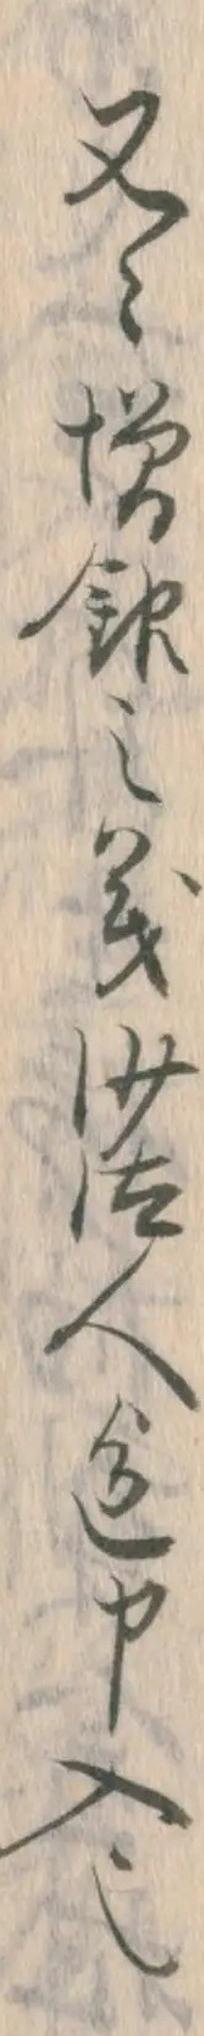又々増銀之義沙汰人迄申入也
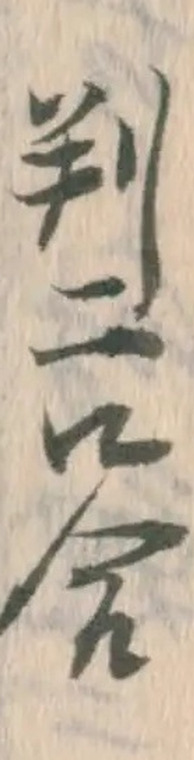判二口合
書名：賀茂社記録. 第81冊
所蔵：国立国会図書館 National Diet Library, JAPAN
